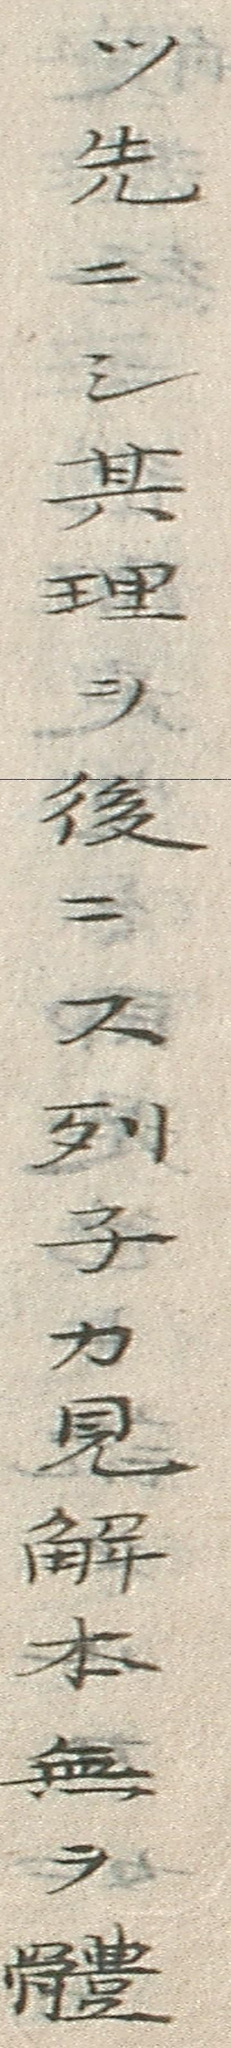ツ先ニシ其理ヲ後ニス列子カ見解本無ヲ体
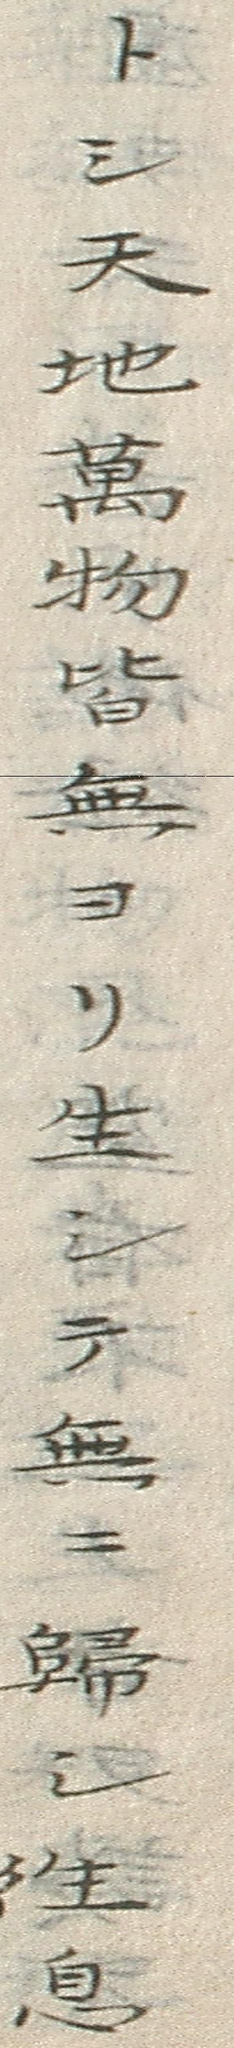トシ天地万物皆無ヨリ生シテ無ニ帰シ往息
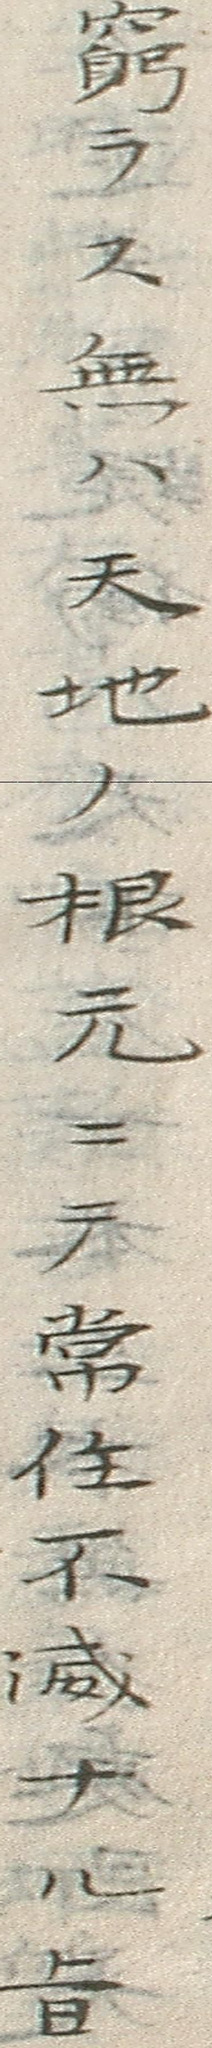窮ラス無ハ天地ノ根元ニテ常住不減ナル旨

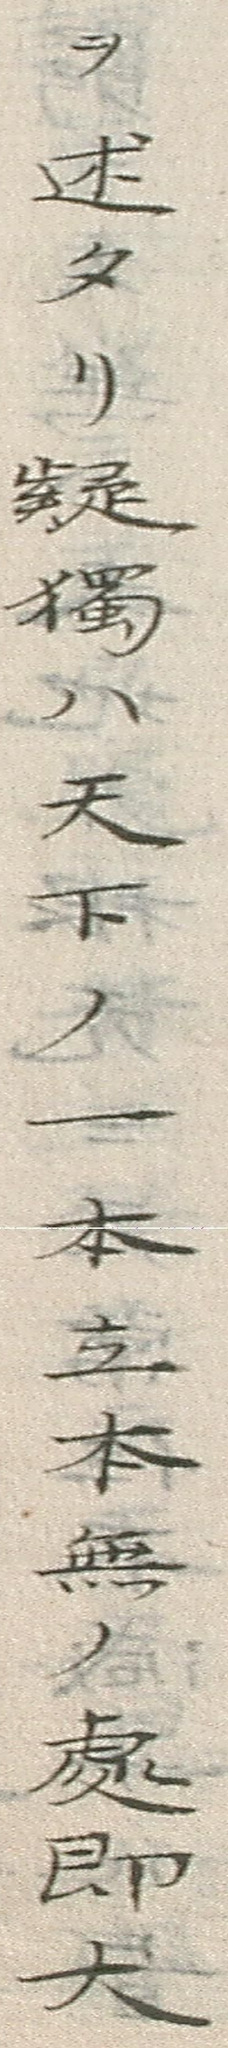ヲ述タリ疑独ハ天下ノ一本立本無ノ処即大
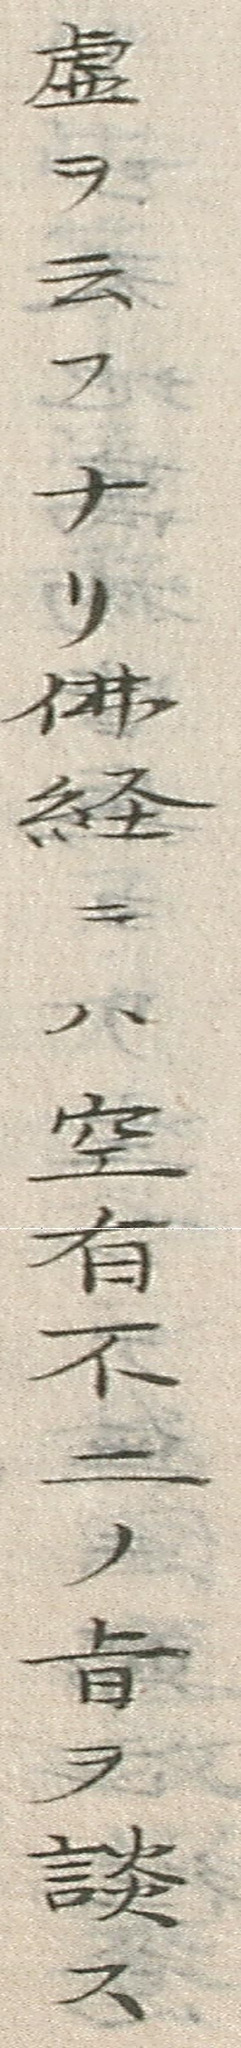虚ヲ云フナリ仏経ニハ空有不二ノ旨ヲ談ス
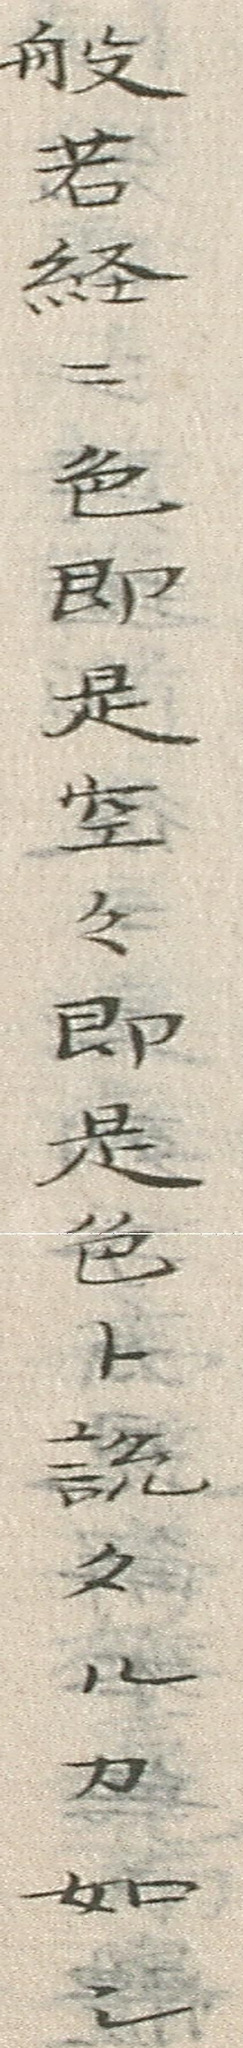般若経ニ色即是空々即是色ト説タルカ如シ
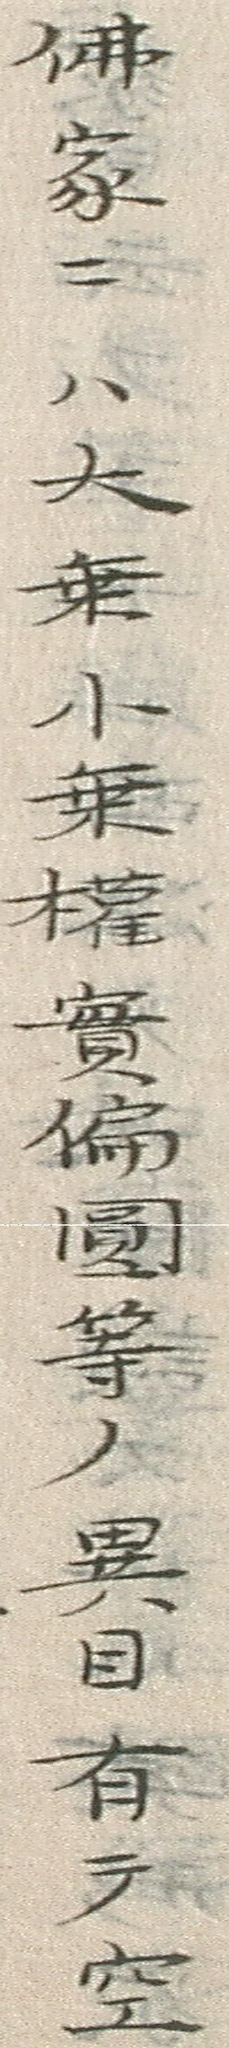仏家ニハ大乗小乗権実偏円等ノ異目有テ空
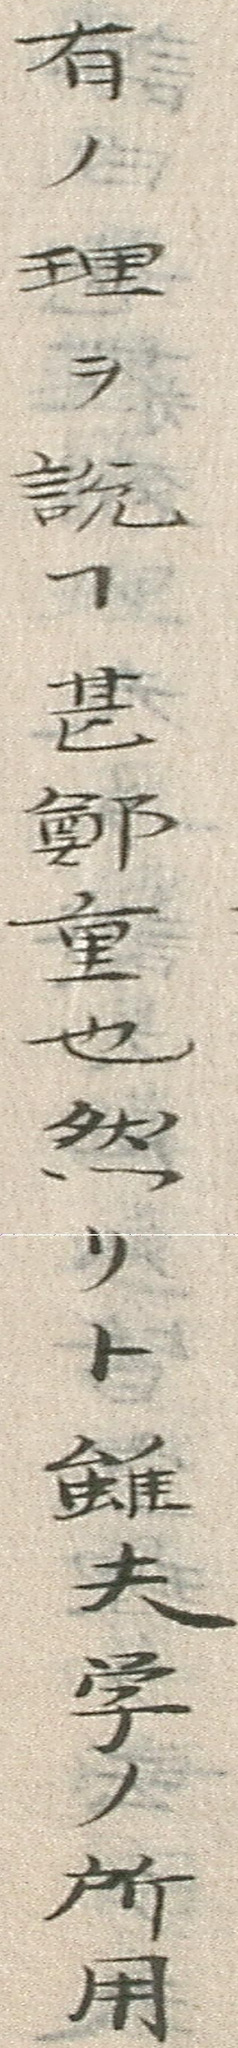有ノ理ヲ説コト甚鄭重也然リト雖夫学ノ所用
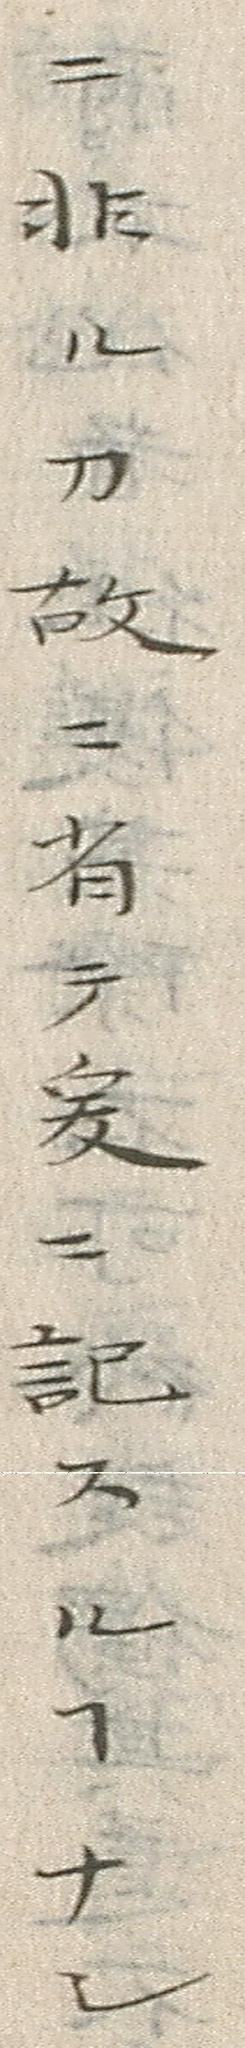ニ非ルカ故ニ省テ爰ニ記スルコトナシ
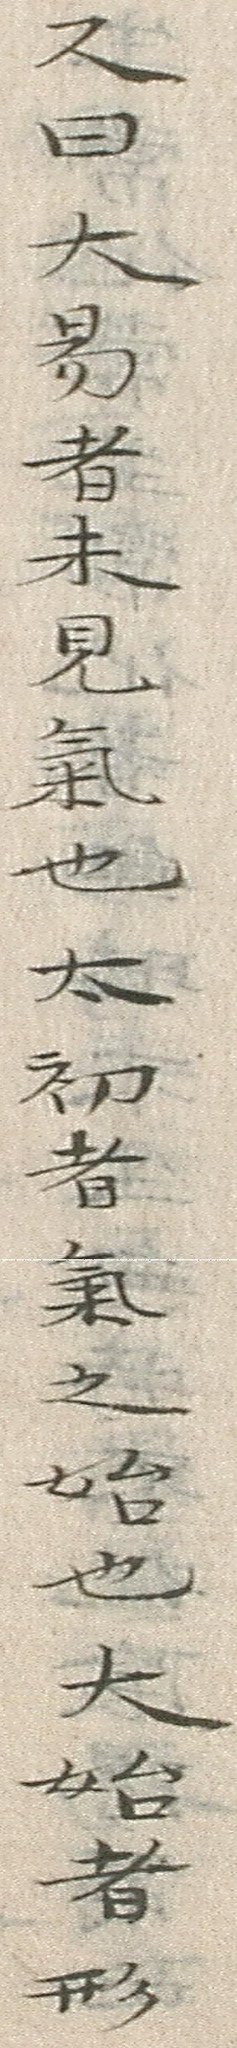又曰大易者未見気也太初者気之始也大始者形
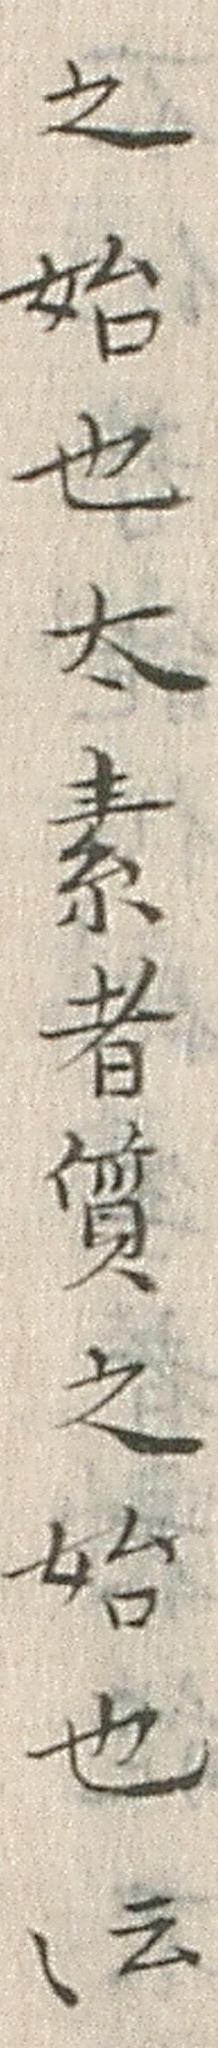之始也太素者質之始也云〻
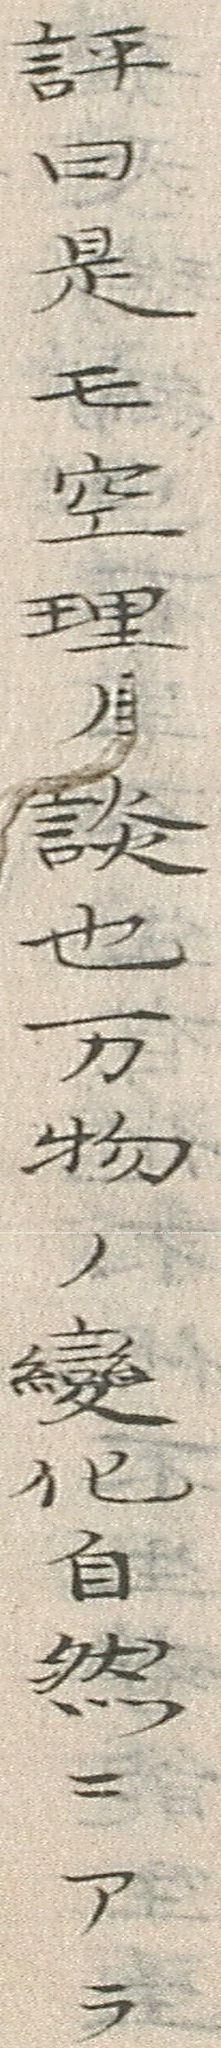評曰是モ空理ノ談也万物ノ変化自然ニアラ
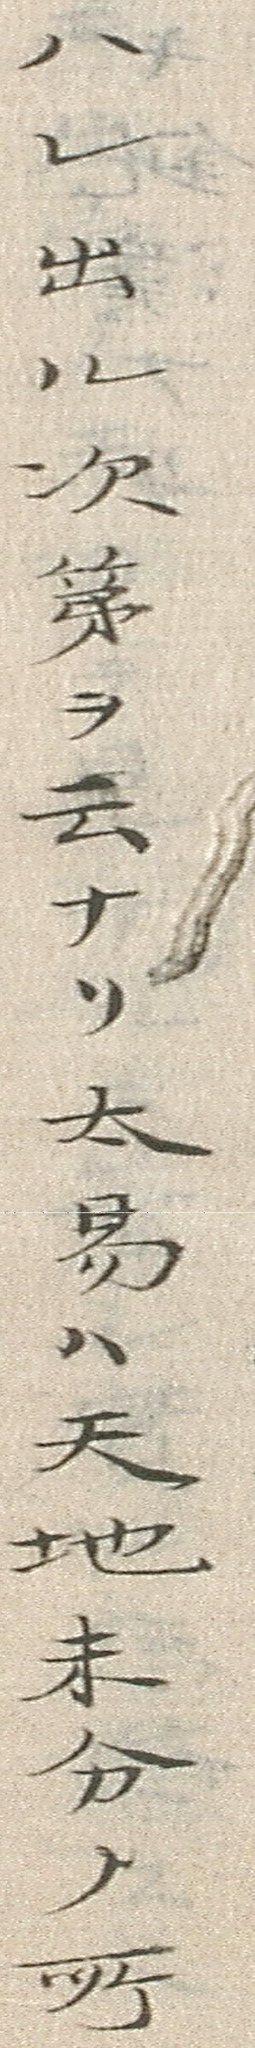ハレ出ル次第ヲ云ナリ太易ハ天地未分ノ所
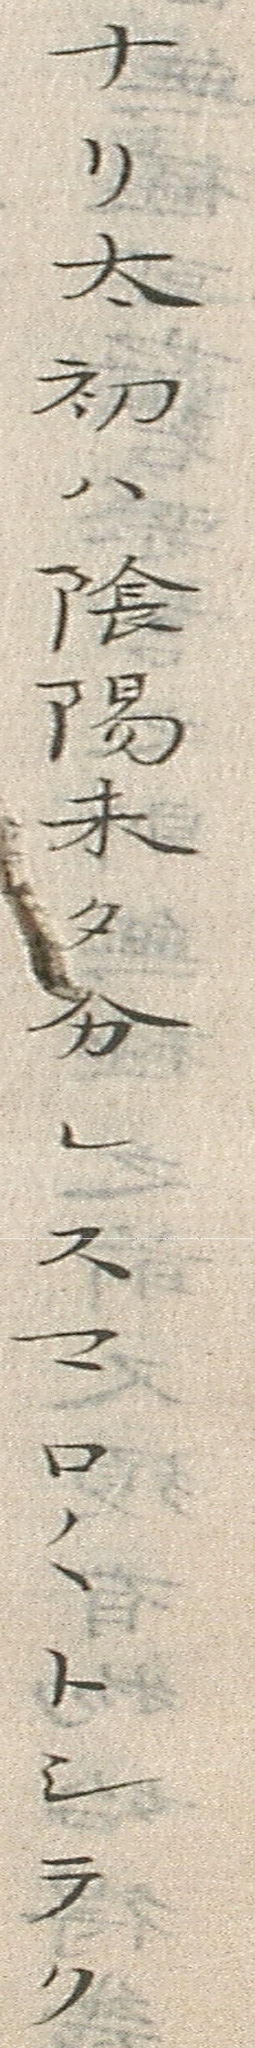ナリ太初ハ陰陽未タ分レスマロ〳〵トシラク
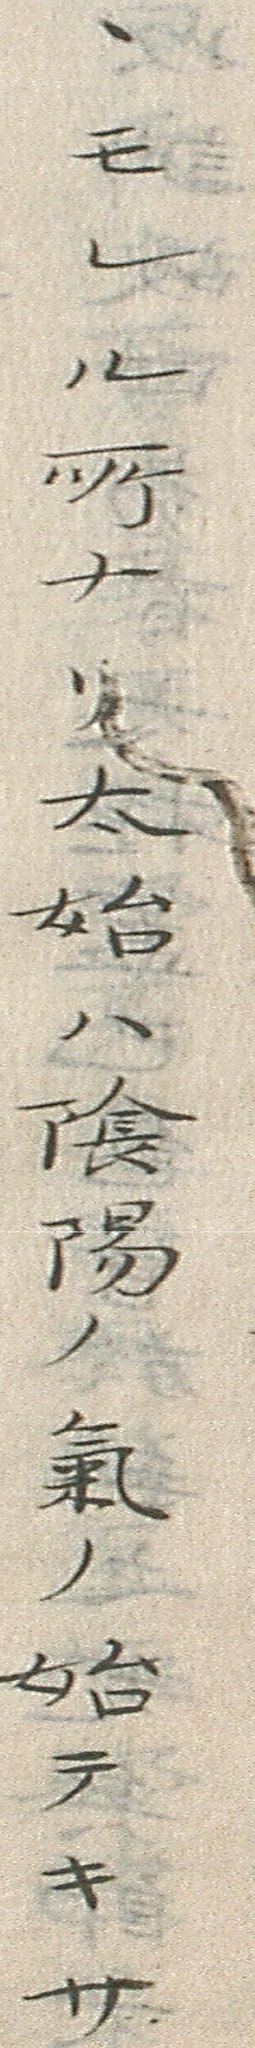ヽモレル所ナリ太始ハ陰陽ノ気ノ始テキサ
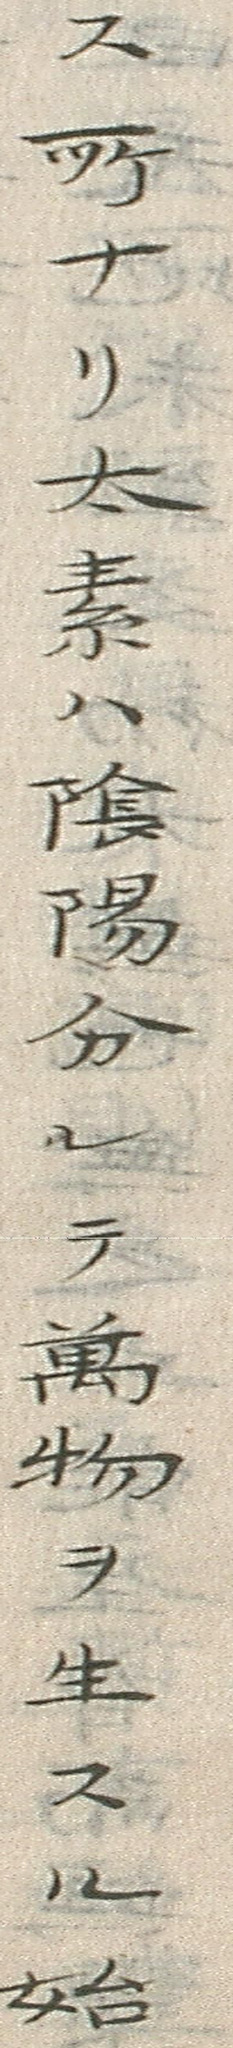ス所ナリ太素ハ陰陽分レテ万物ヲ生スル始
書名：天學略名目羽翼　全
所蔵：東京大学地震研究所図書室 Earthquake Research Institute Library, The University of Tokyo, JAPAN
